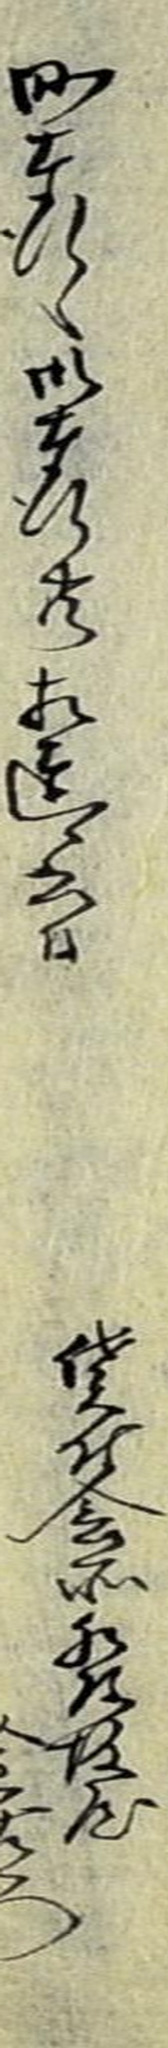町奉行へ御奉行共相達候書付貸付会所発坂屋
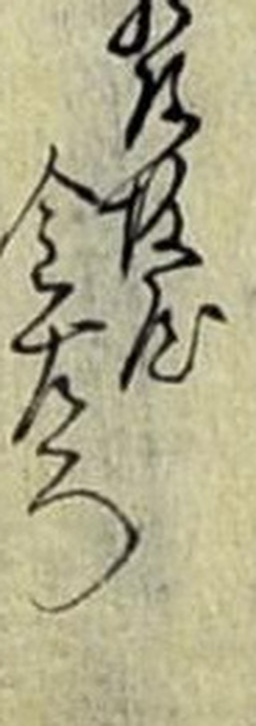金左衛門
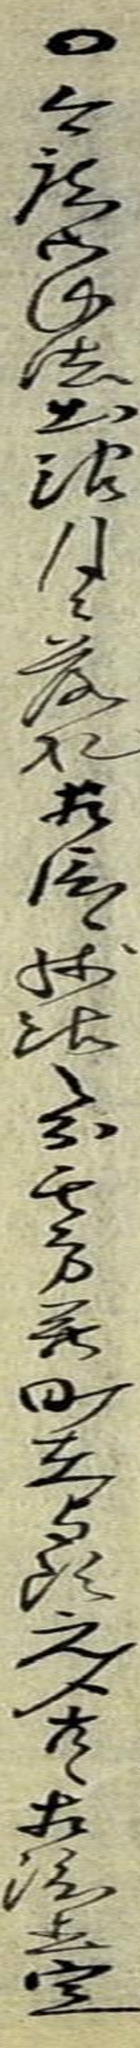〇今度御趣法出銀月々落札相渡候残銀之分其方并町在与頭元〆共へ相渡置定
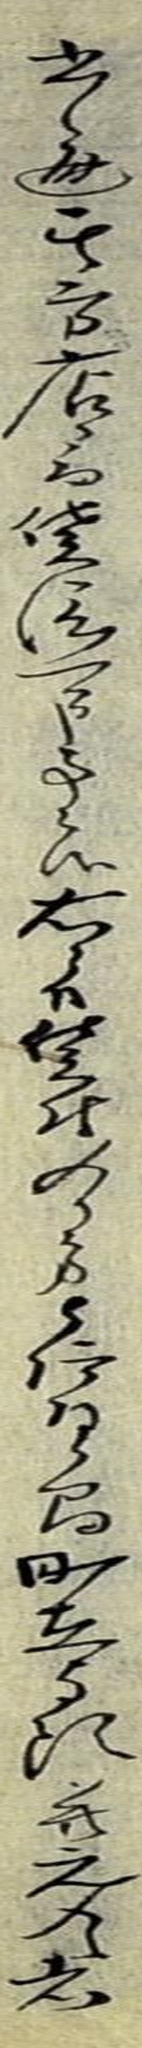書之通其方店に而貸渡可申事に候右に付貸付〆り方被仰付候間町在与頭并元〆之者
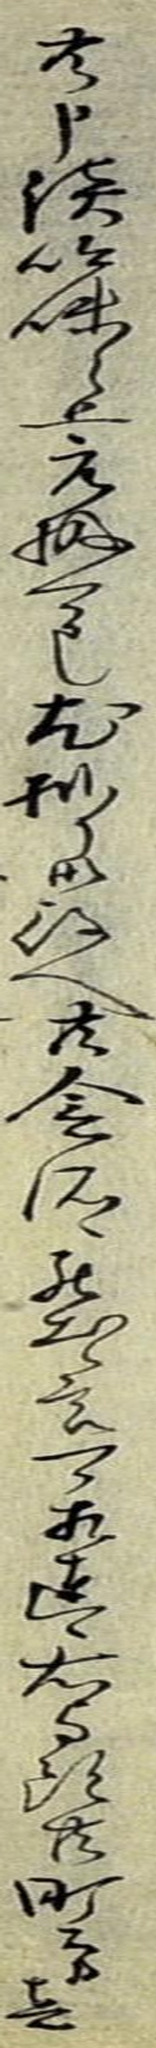共申談吟味之上取扱可申候尤掛り御役人共会所へ罷出候節可相達候右与頭共町方壱
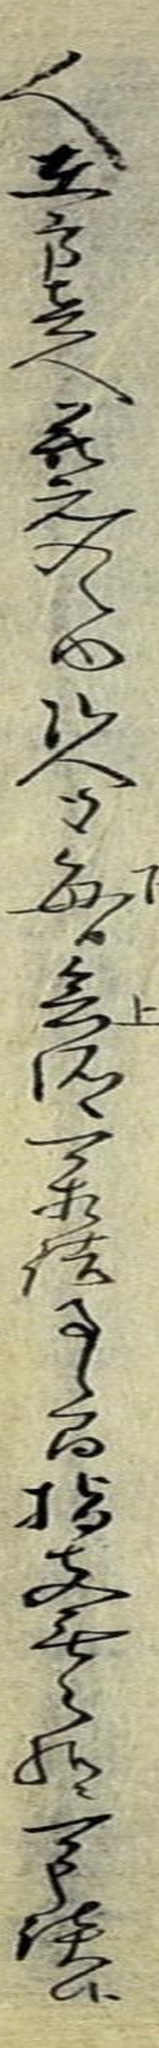人在方壱人并元〆之内弐人ツヽ毎日会所へ可相詰事候間指支無之様に可申談候
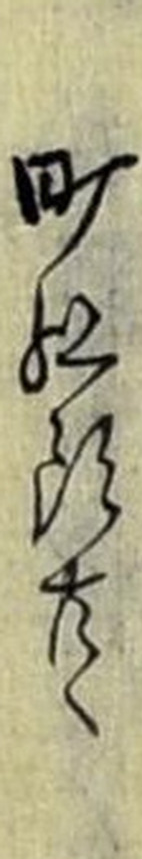町組頭共へ
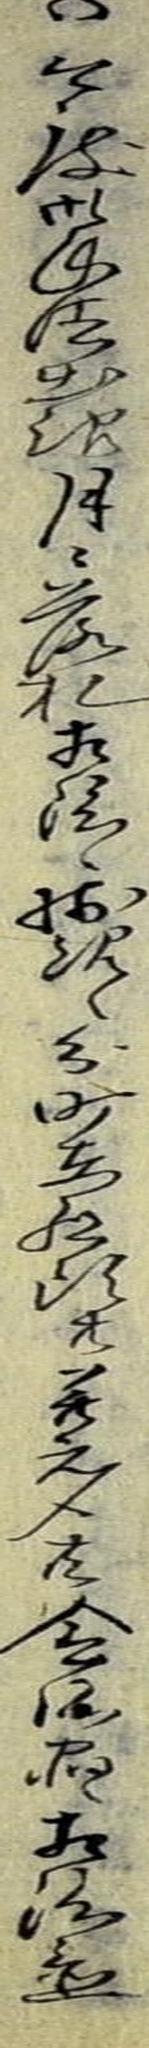〇今度御趣法出銀月々落札相渡候残銀之分町在組頭共元〆共会所宿へ相渡置
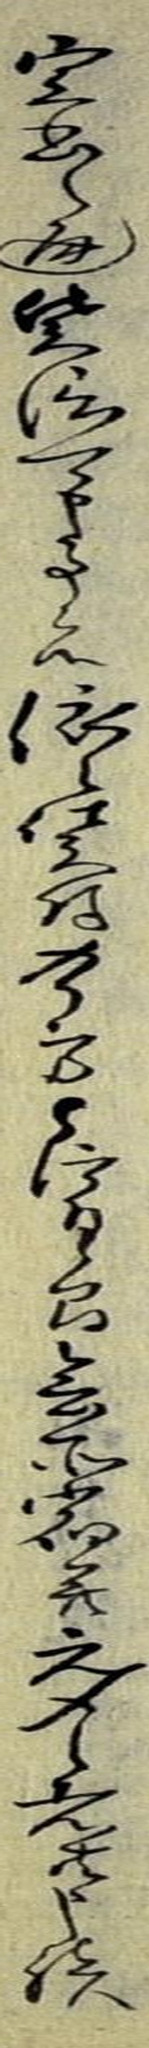定書之通貸渡可申事に候依之貸付〆り方被仰付候間会所宿并元〆之者共申談
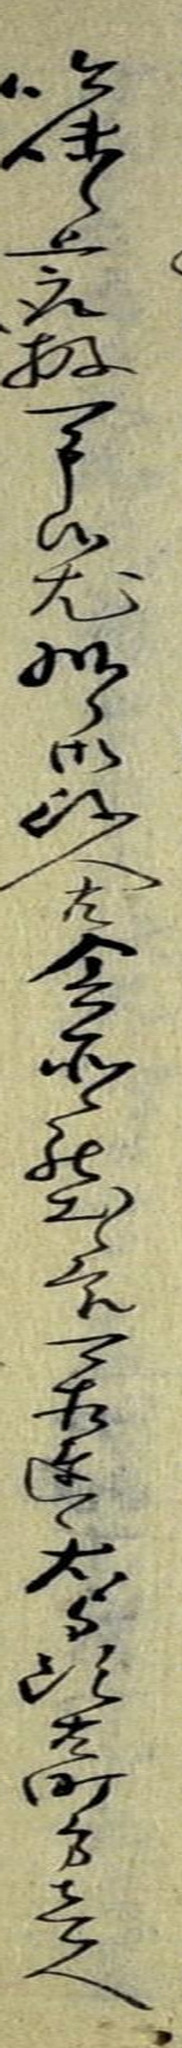吟味之上取扱可申候尤掛り御役人共会所へ罷出候節可相達候右与頭共町方壱人
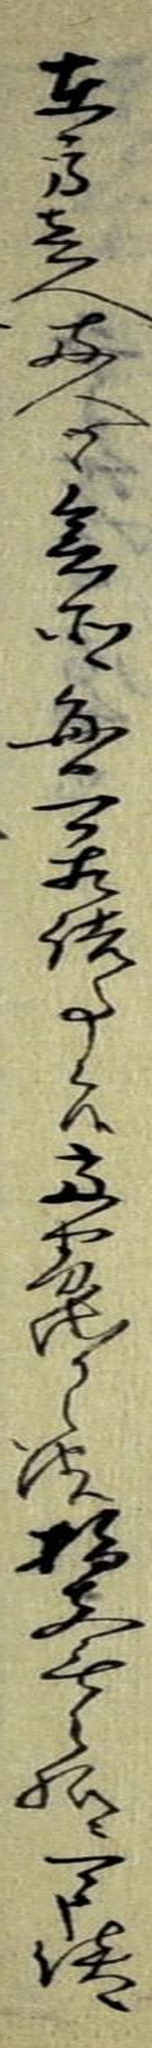在方壱人両人ツヽ会所へ毎日可相詰事に候当番代り之儀は指支無之様に可申談候
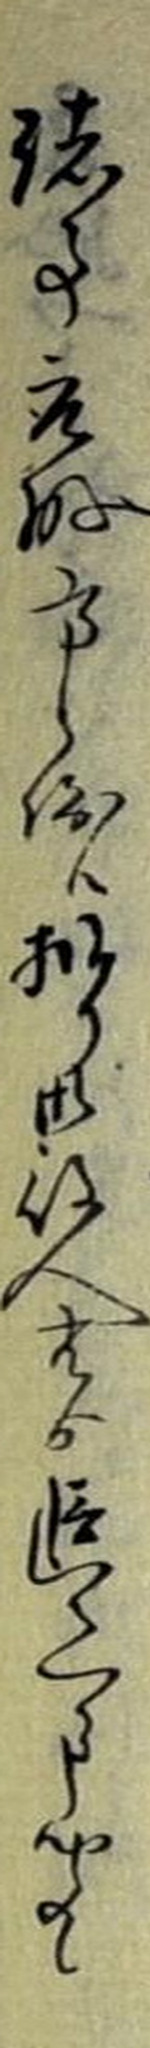諸事取扱方之儀は掛り御役人共ゟ追々可申聞候
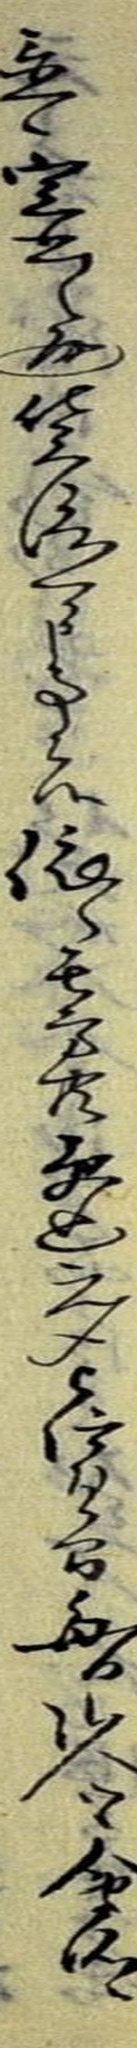置候定書之通貸渡可申事に候依之其方共受込元〆被仰付候間毎日弐人ツヽ会所へ
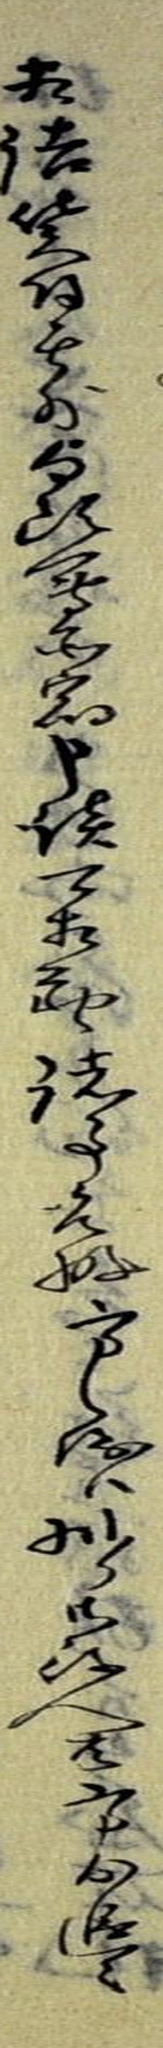相詰貸付其外与頭会所宿申談可相勤候諸事取扱方之儀は掛り御役人共方ゟ追々
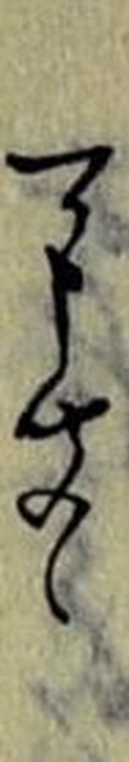可申聞候
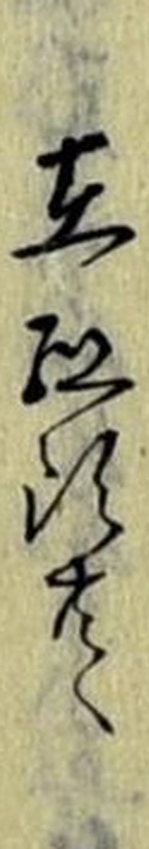町組頭共へ
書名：命令之部 二
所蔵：福井県文書館 Fukui Prefectural Archives
